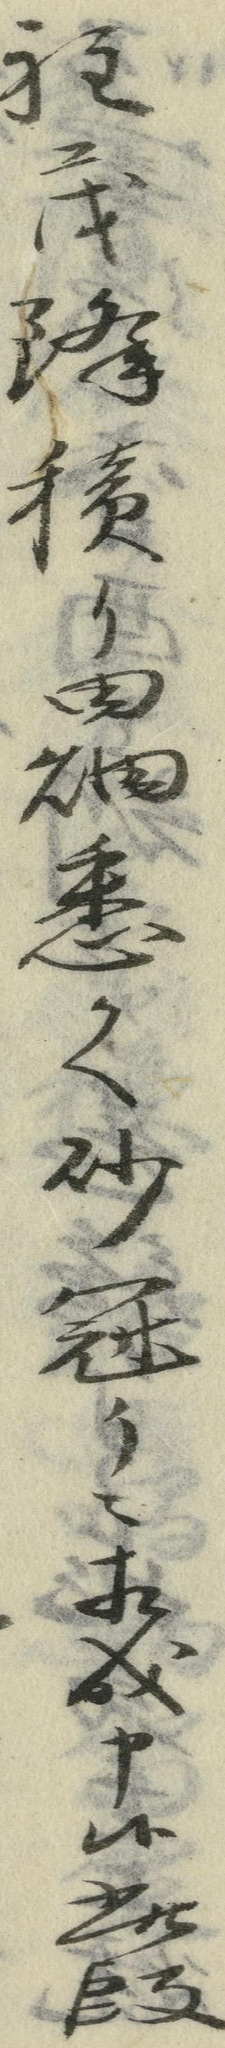程茂降積リ田畑悉く砂冠リニ相成申候此段
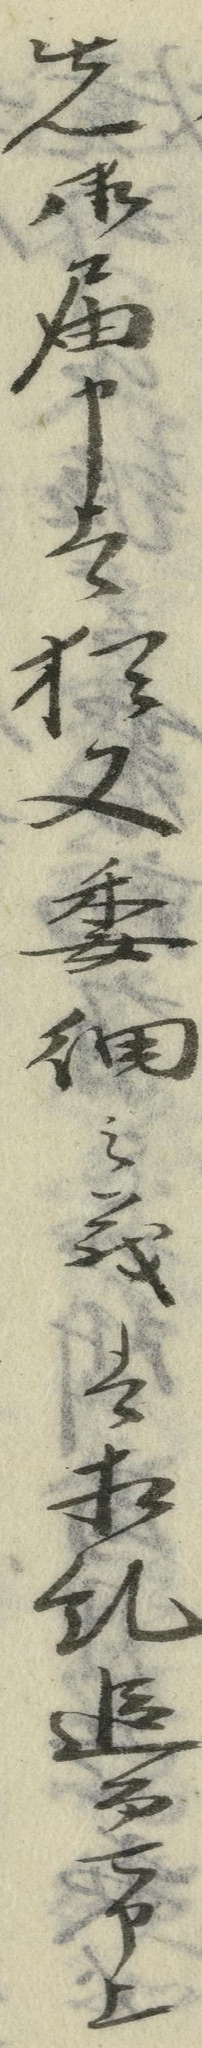先御届申上候猶又委細之義は相糺追而可申上
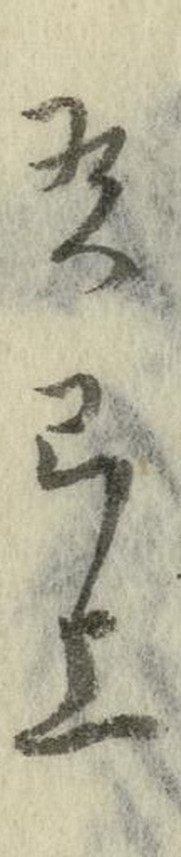候已上
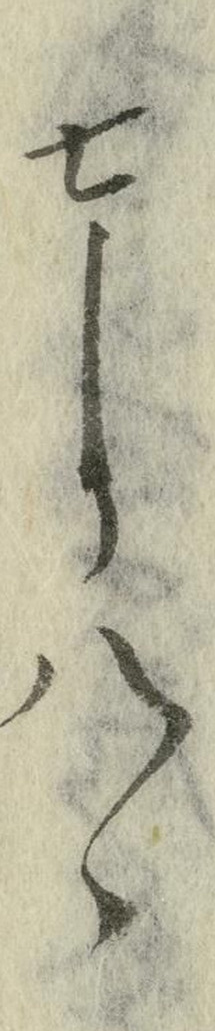七月八日
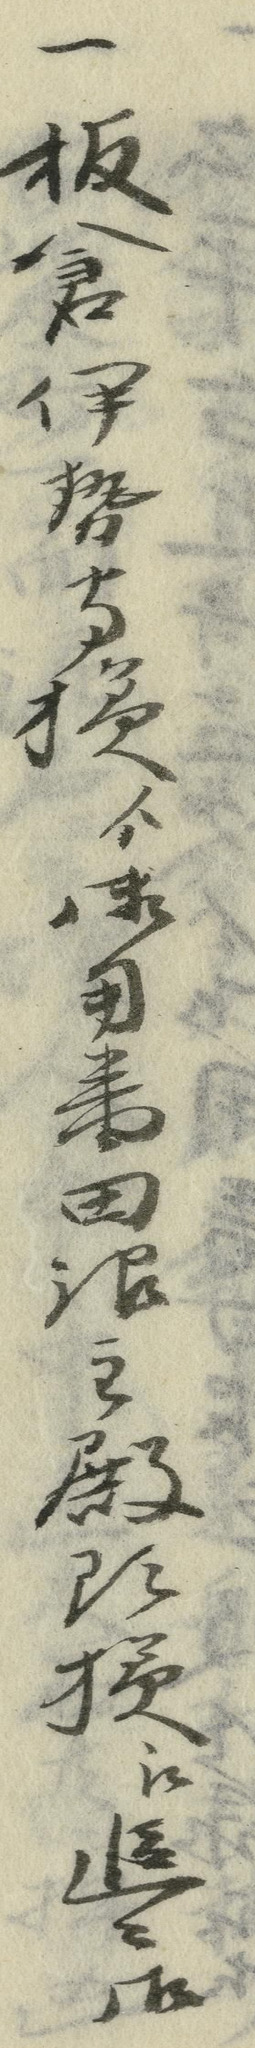一板倉伊勢守様ゟ御用番田沼主殿頭様江追々御
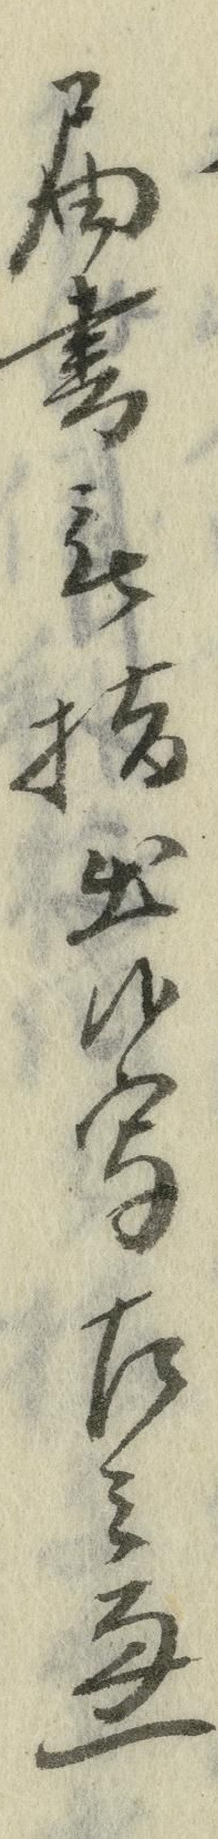届書被指出候写左之通
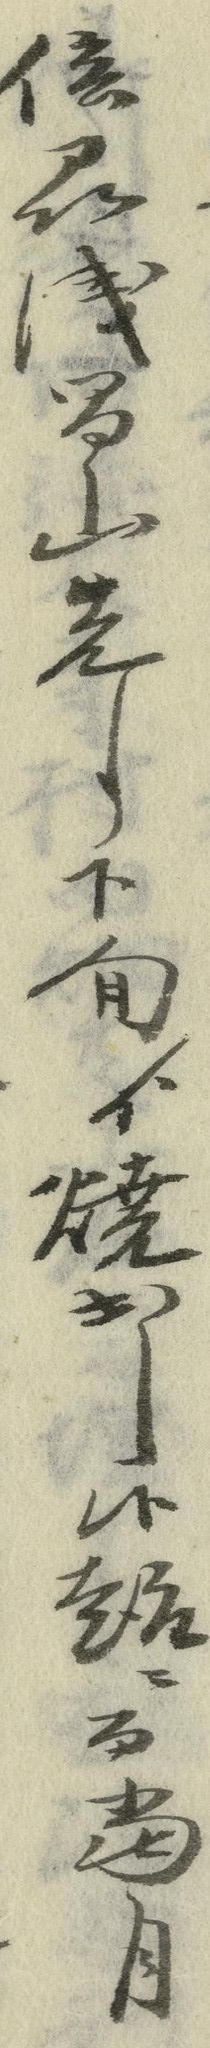信州浅間山先月下旬ゟ焼出し候趣ニ而当月
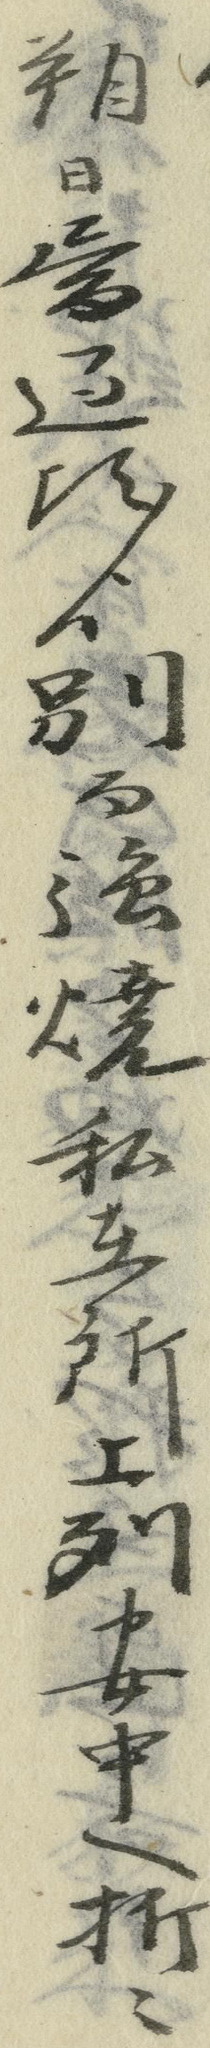朔日昼過頃ゟ別而強焼私在所上州安中ヘ折々
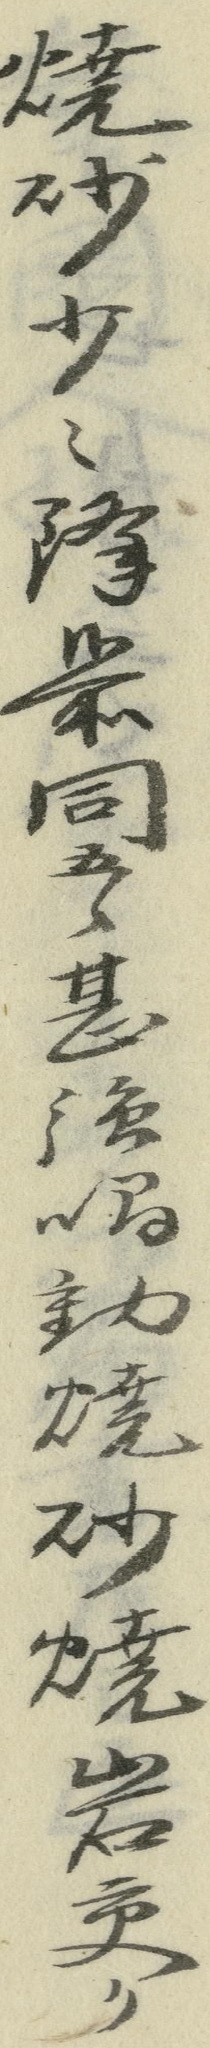焼砂少々降候所同五日甚強鳴動焼砂焼岩交リ
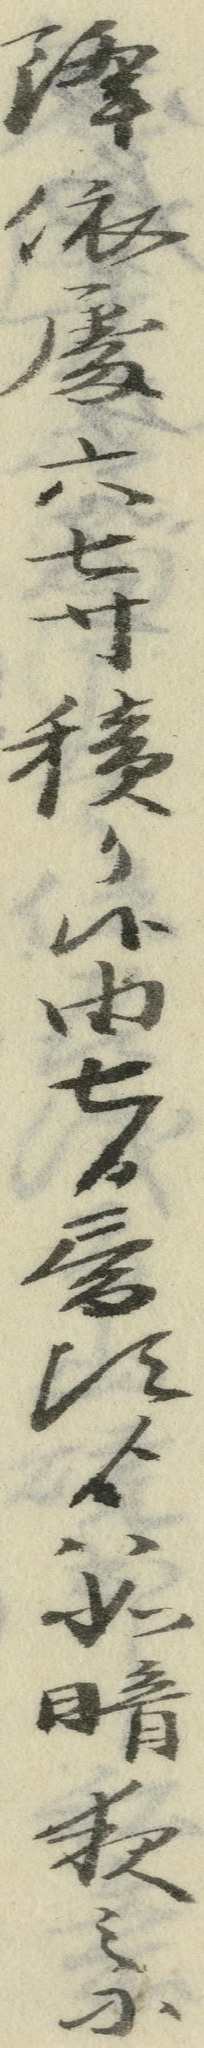降依処六七寸積リ候由七日昼頃ゟは晴夜之に
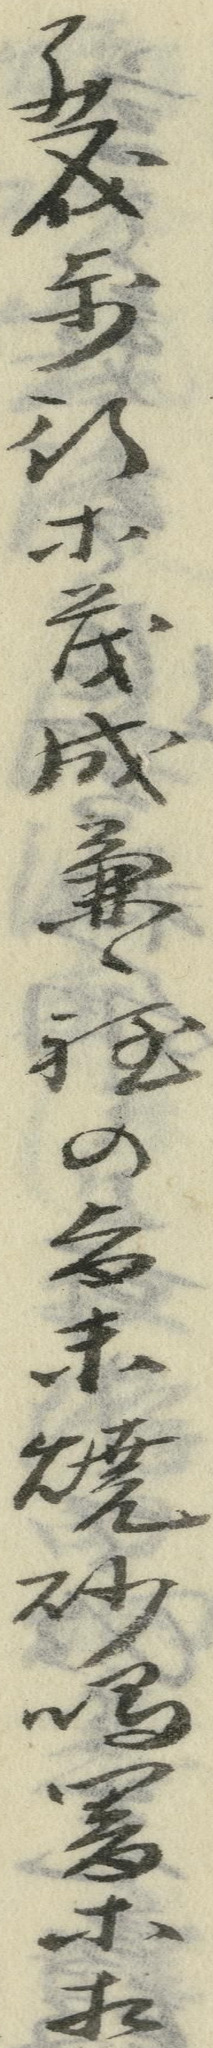罷成歩行等茂成兼候程の旨未焼砂鳴響等相
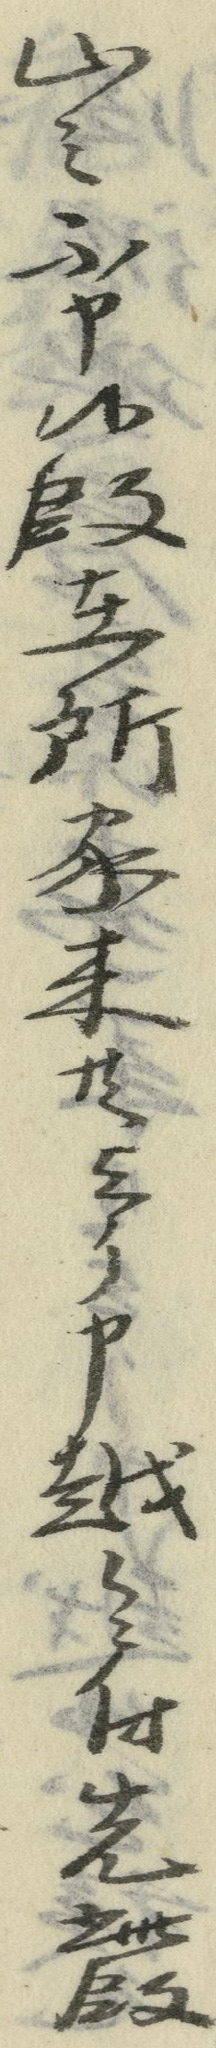止み不申候段在所家来共よリ申越候ニ付先此段
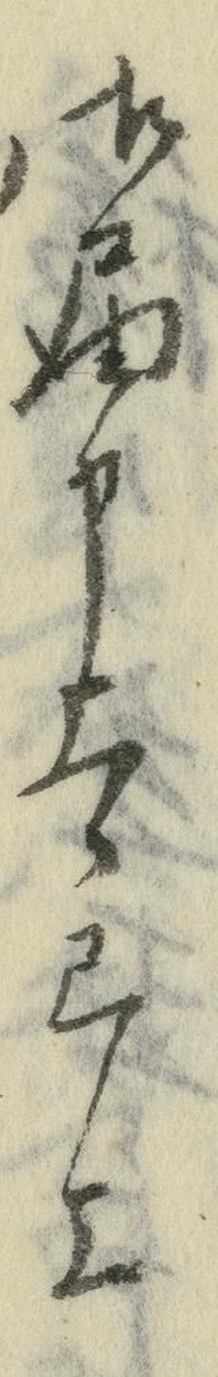御届申上候已上
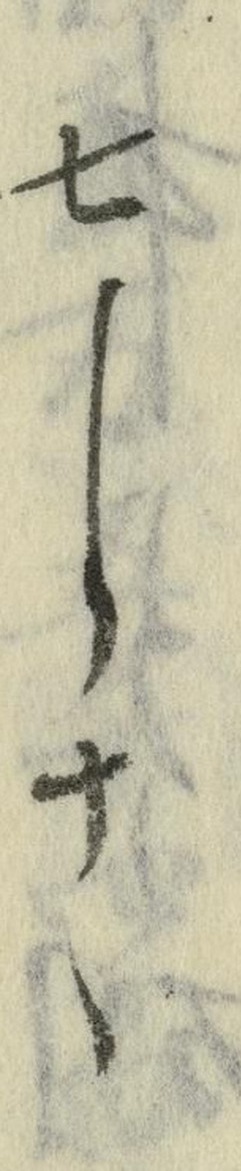七月十日
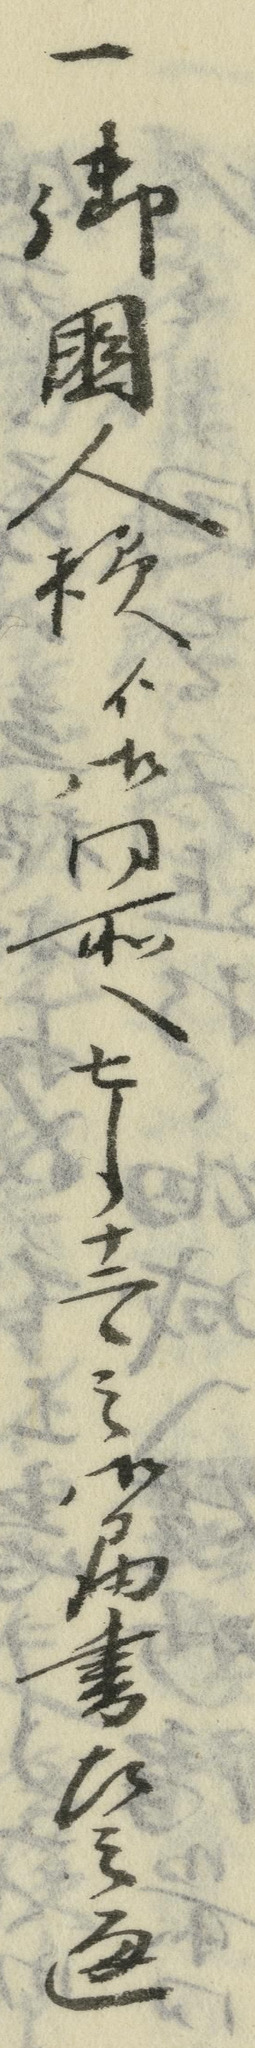一御国人様ゟ御同所へ七月十二日之御届書左之通
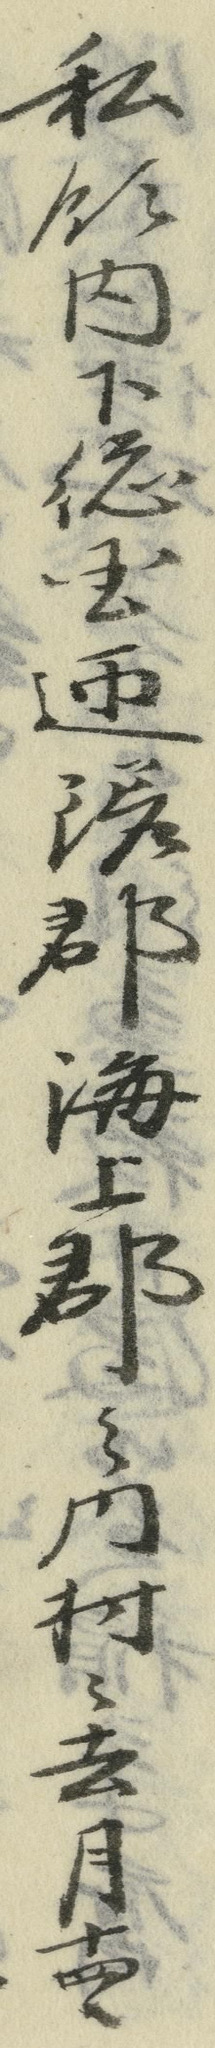私領内下総国匝瑳郡海上郡之内村々去月十四日
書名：天明三癸卯七月信州浅間山焼出シ上州山津浪ニ付近國ヨリ御届書并訴書写
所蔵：東京大学地震研究所図書室 Earthquake Research Institute Library, The University of Tokyo, JAPAN
